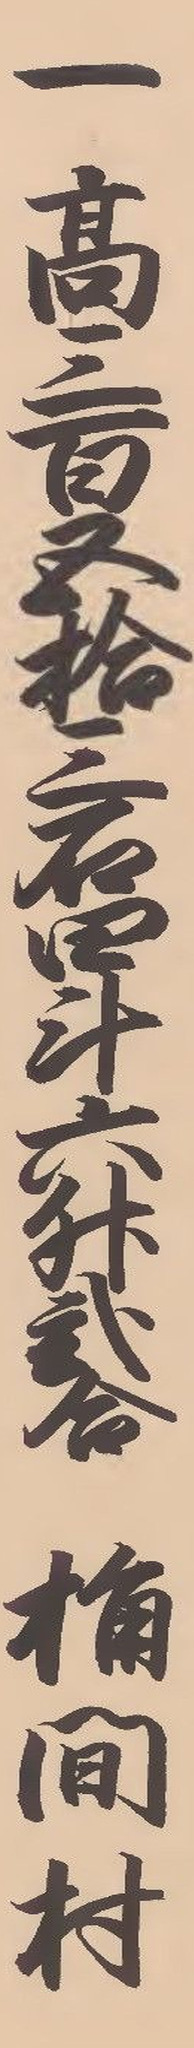一高三百五拾三石四斗六升弐合桷間村
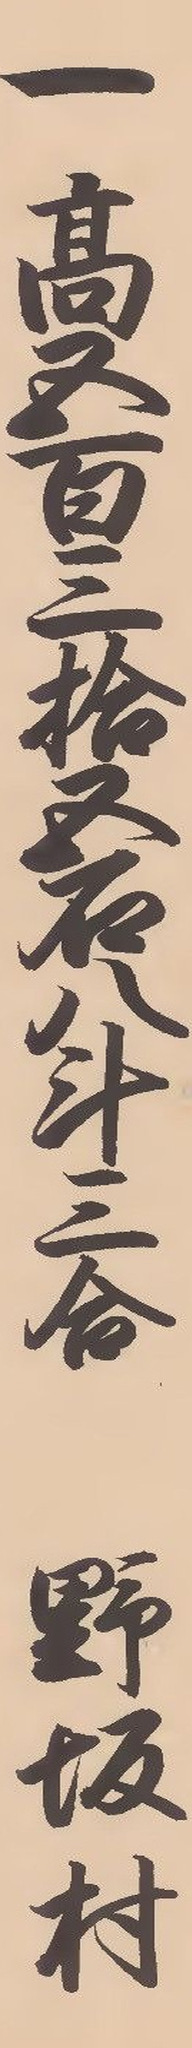一高五百三拾五石八斗三合野坂村
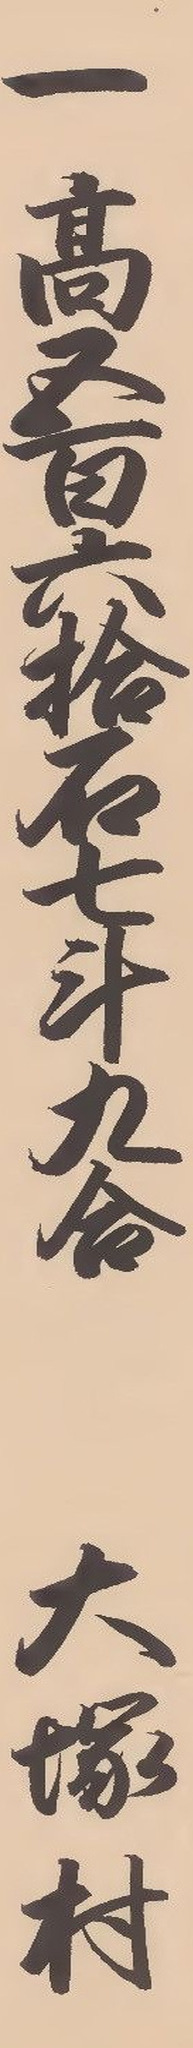一高五百六拾石七斗九合大塚村
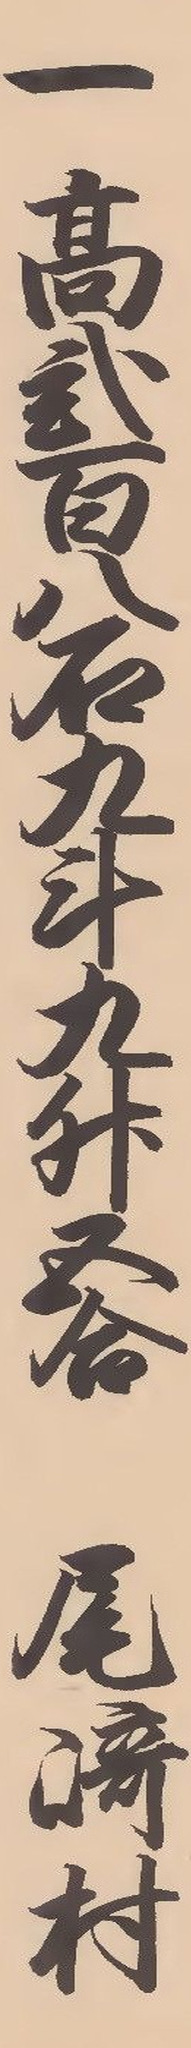一高弐百八石九斗九升五合尾崎村
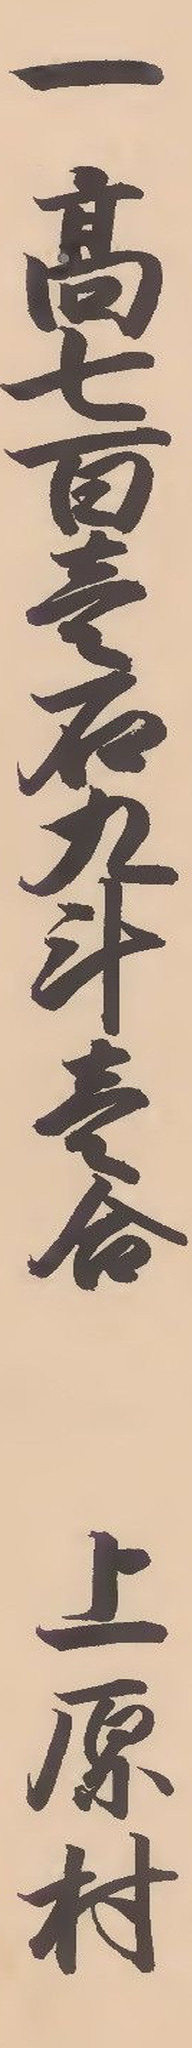一高七百壱石九斗壱合上原村

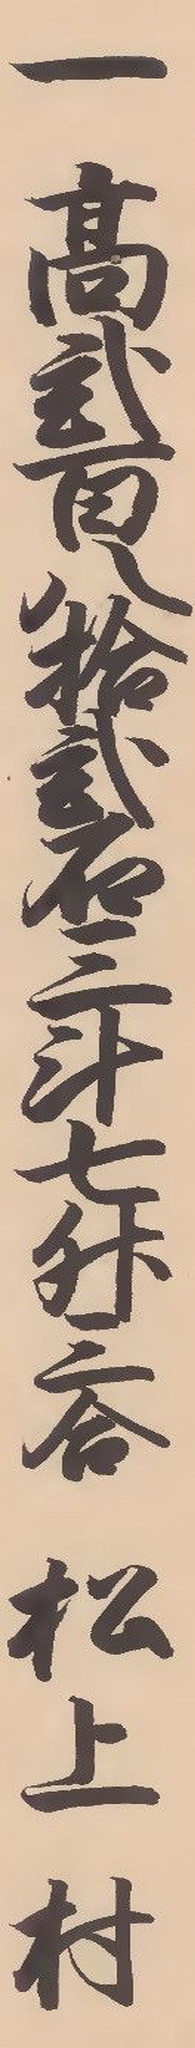一高弐百八拾弐石三斗七升三合松上村
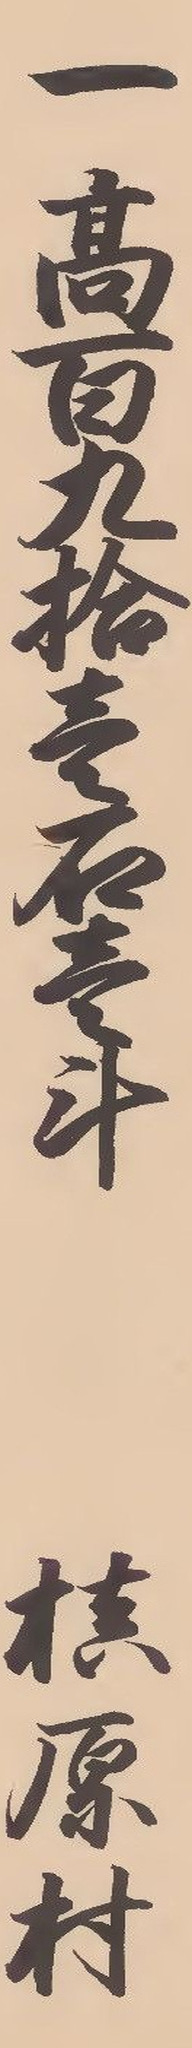一高百九拾壱石壱斗槙原村
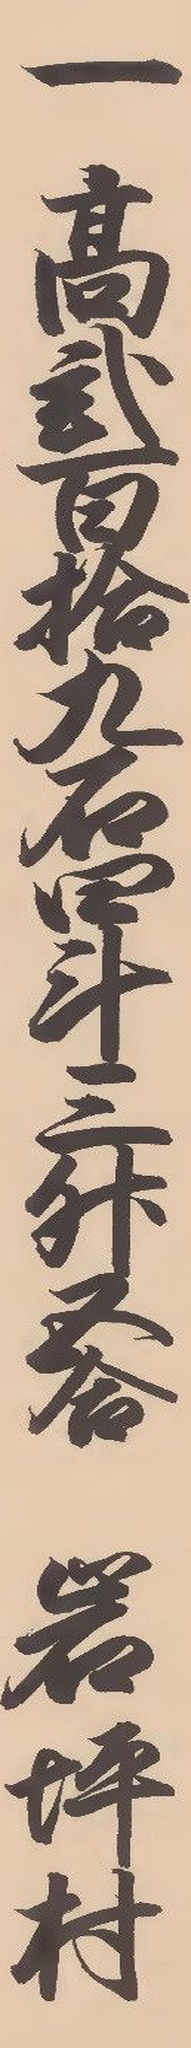一高弐百拾九石四斗三升五合岩坪村
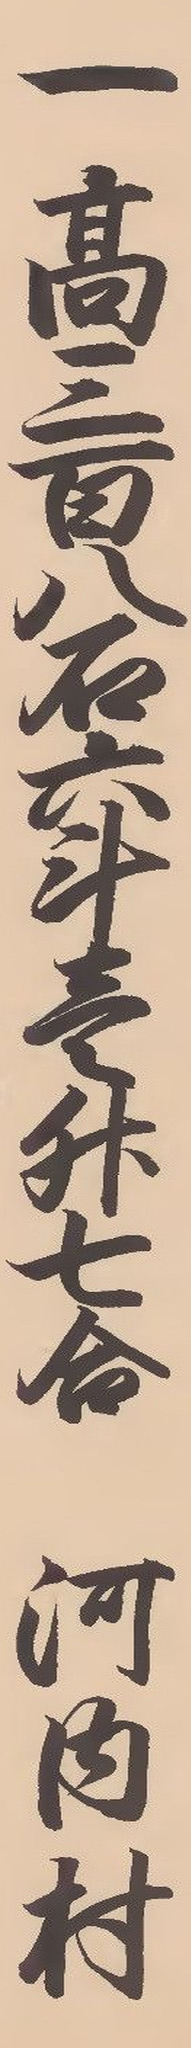一高三百八石六斗壱升七合河内村
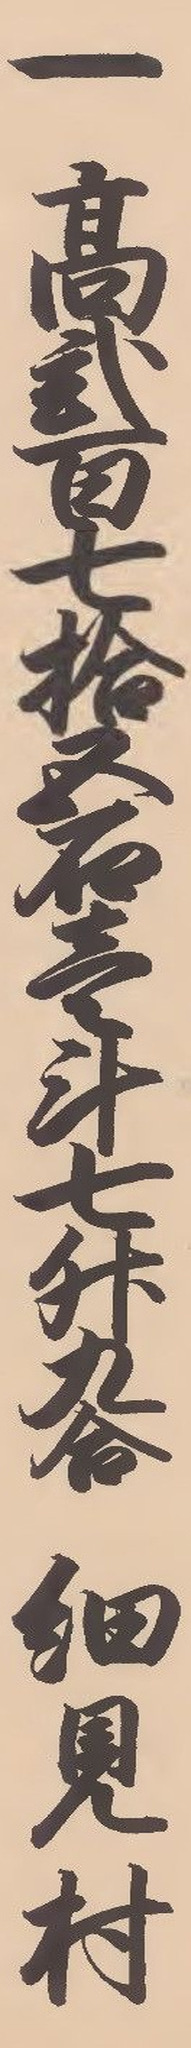一高弐百七拾五石壱斗七升九合細見村
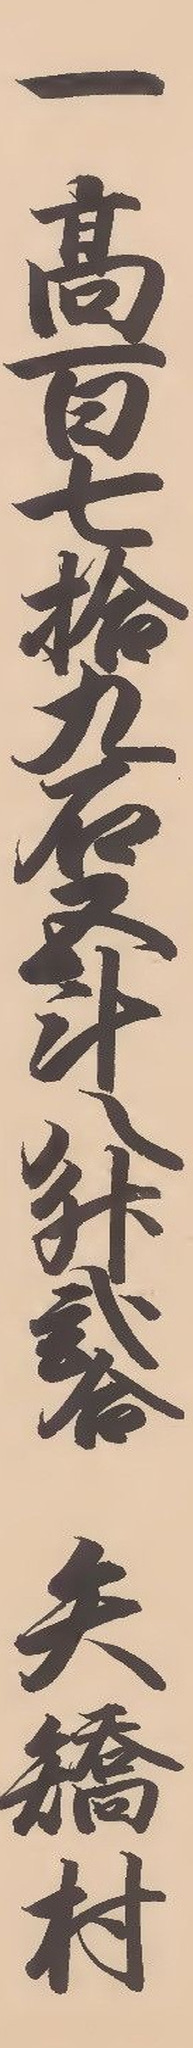一高百七拾九石五斗八升弐合矢矯村
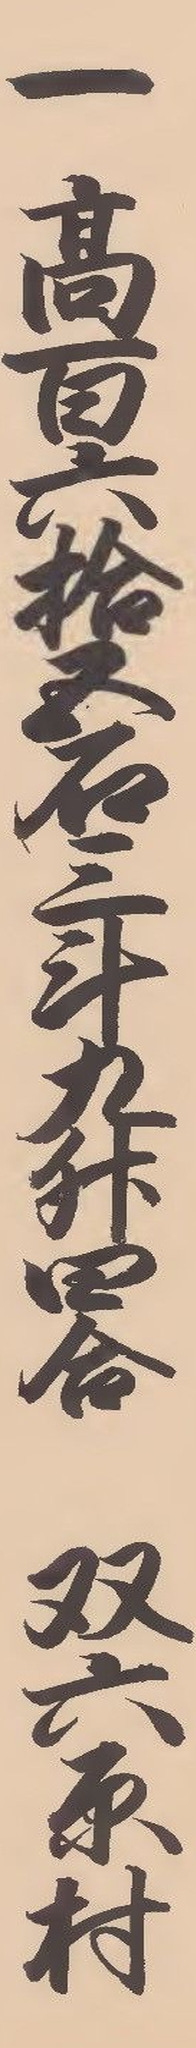一高百六拾五石三斗九升四合双六原村
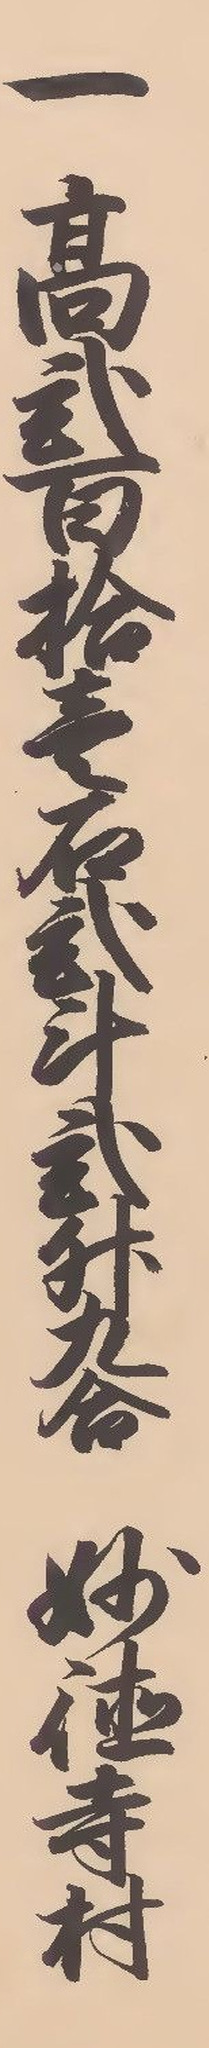一高弐百拾壱石弐斗弐升九合妙徳寺村

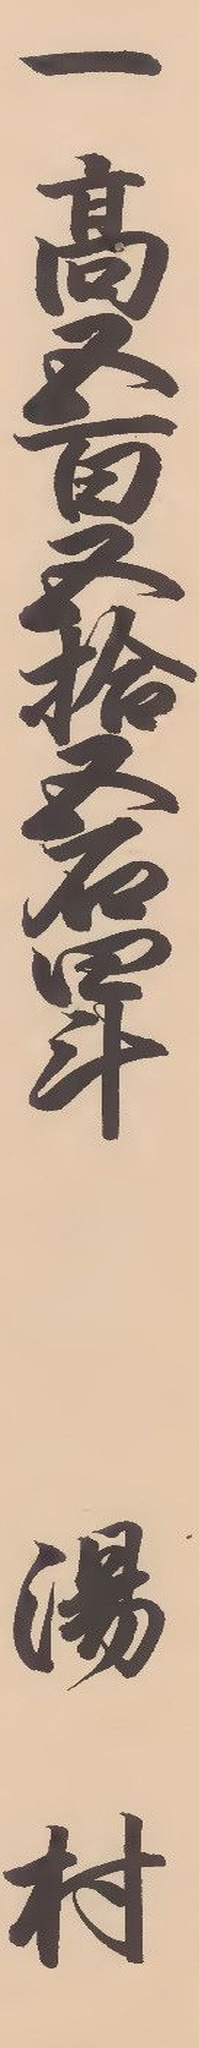一高五百五拾五石四斗湯村
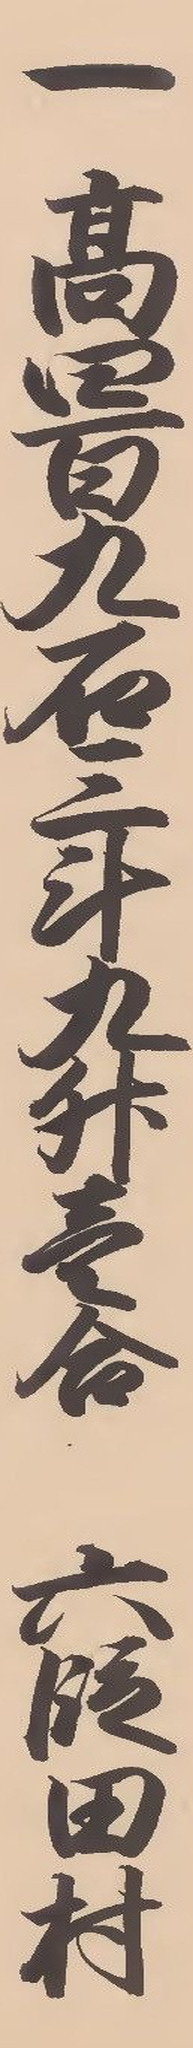一高四百九石三斗九升壱合六段田村
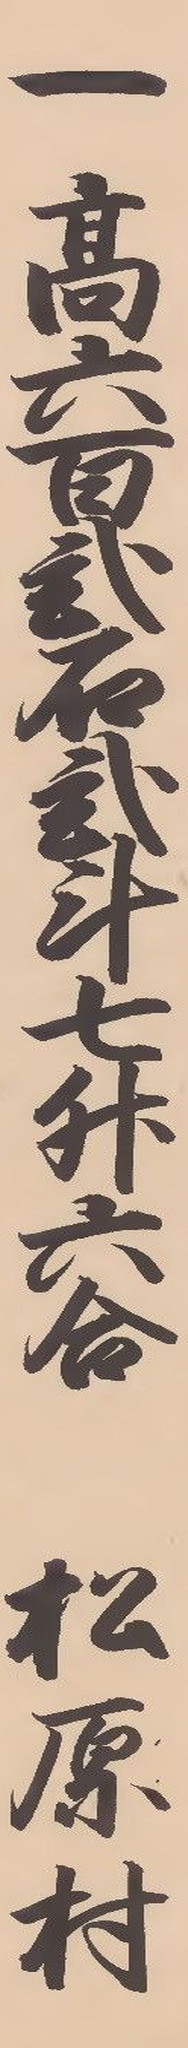一高六百弐石弐斗七升六合松原村
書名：因幡国郷帳
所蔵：国立公文書館 National Archives of Japan
